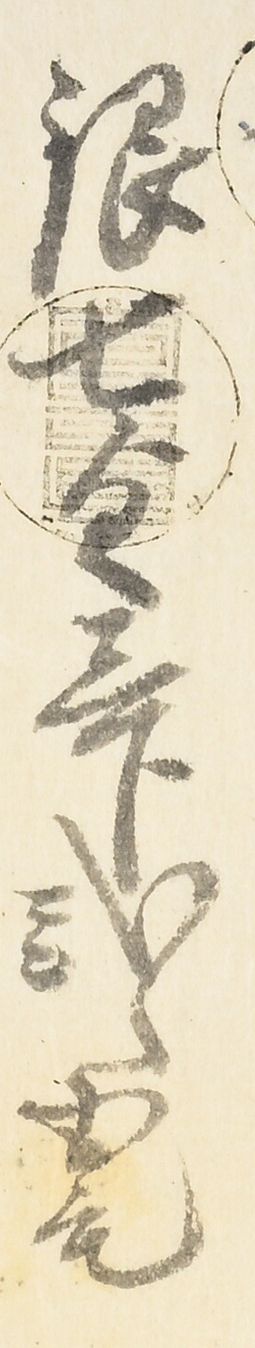銀七匁壱分弐厘五毛
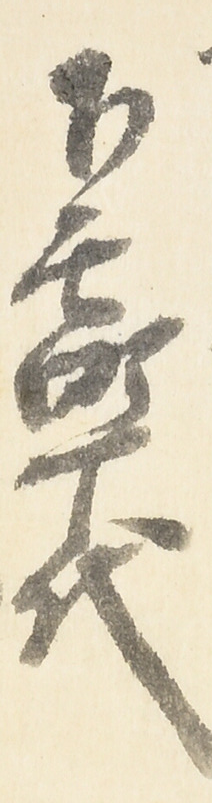下モ町丁代
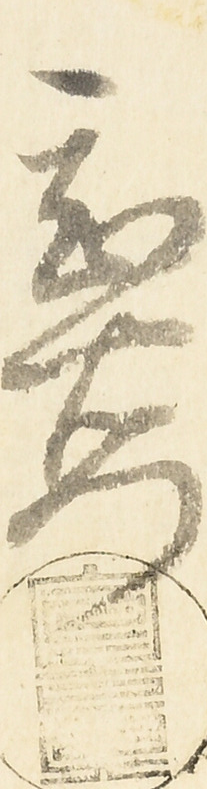甚右衛門
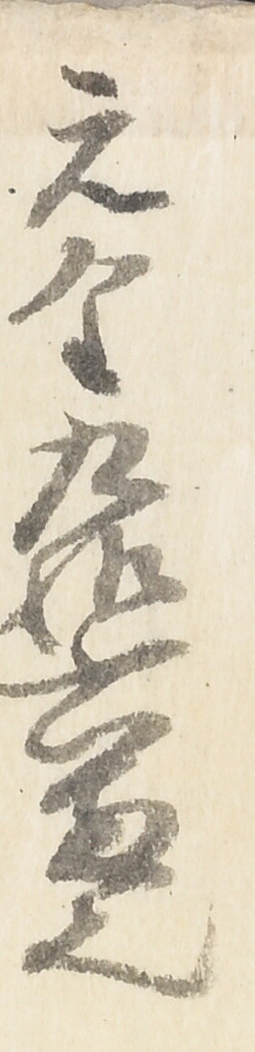元金九拾六両也
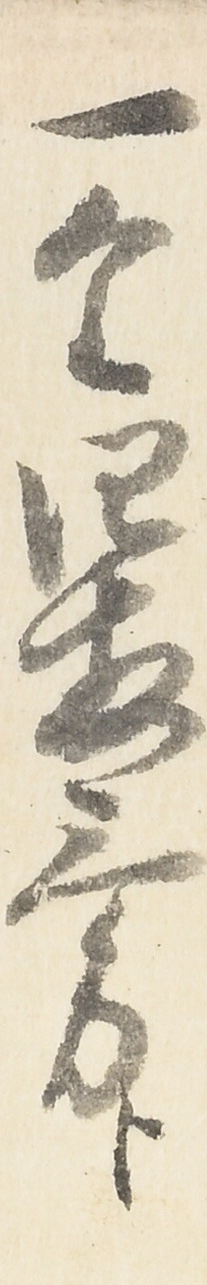〆金四両三分ト
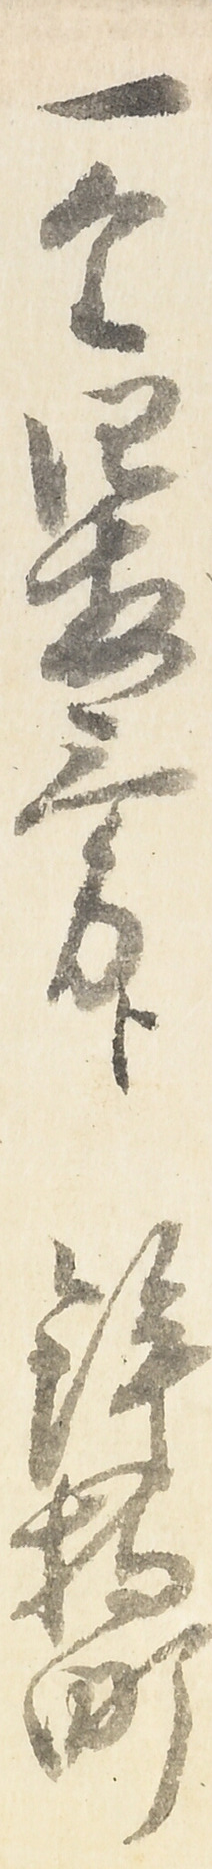一金四両三分ト鉾持町
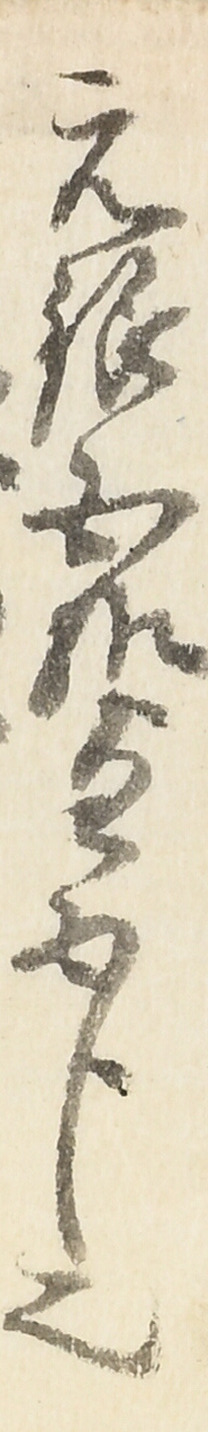元銀五拾匁五分也
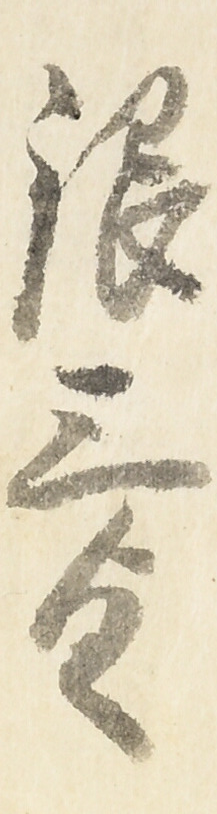銀三匁
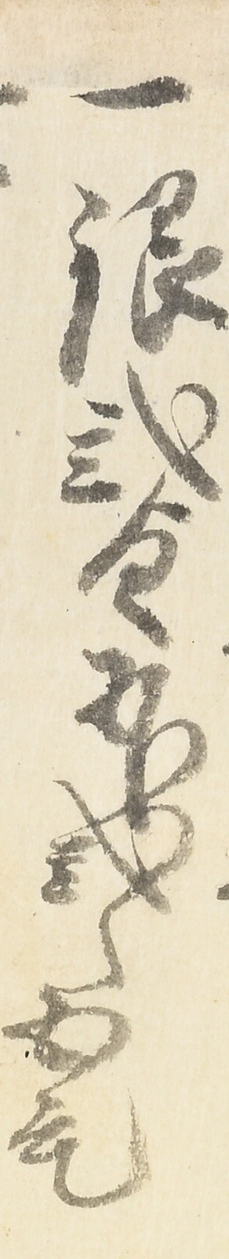一銀弐匁五分弐厘五毛
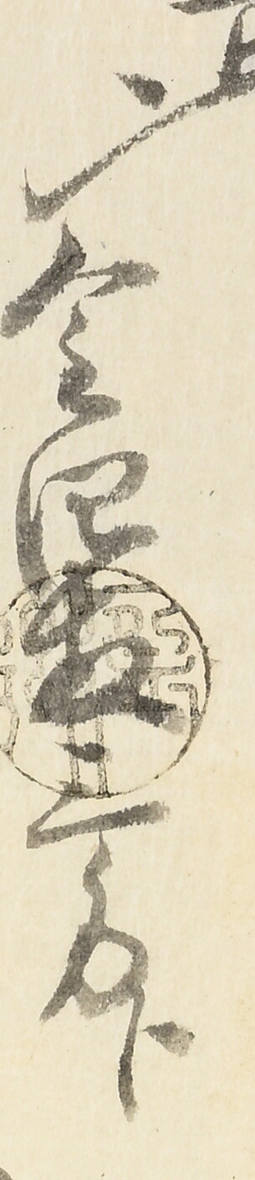〆金四両三分ト
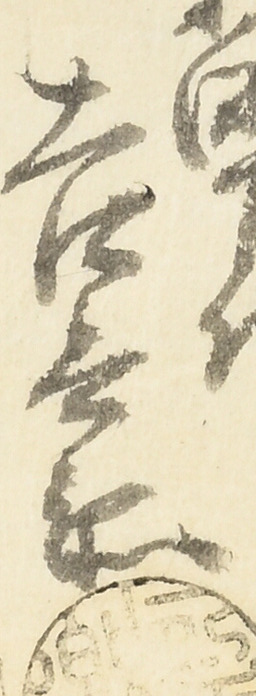吉兵衛
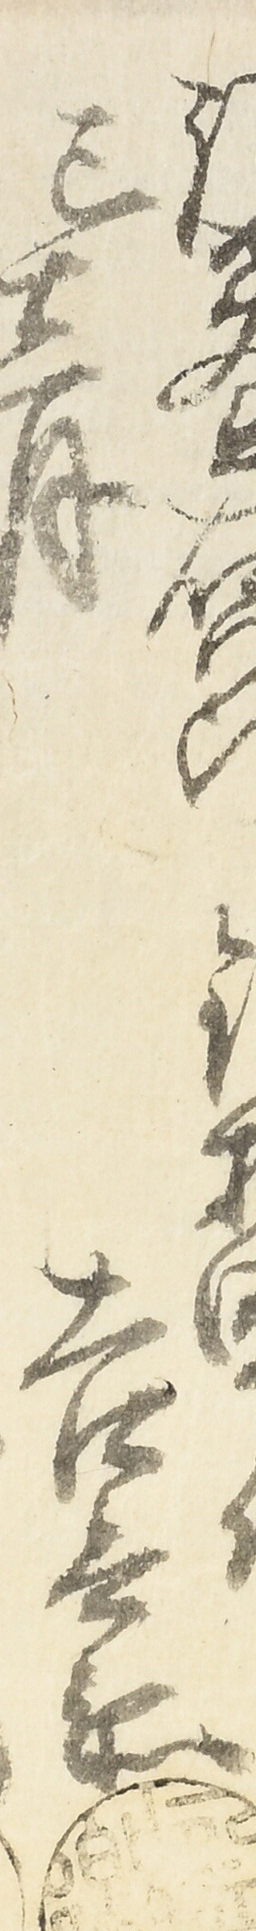巳十二月藤右衛門
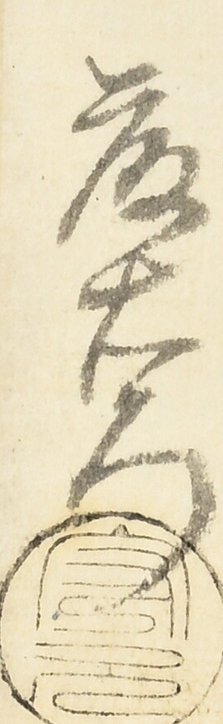甚右衛門

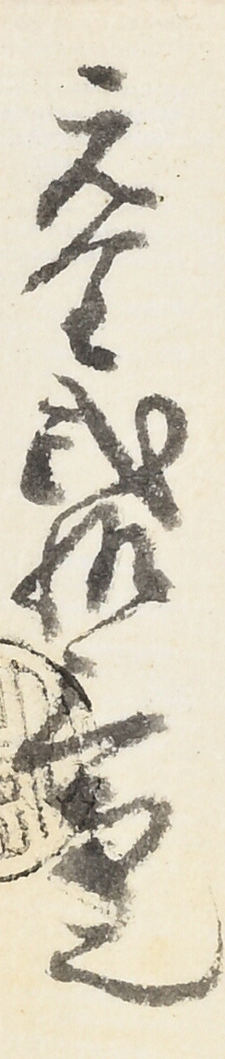元金弐拾三両也
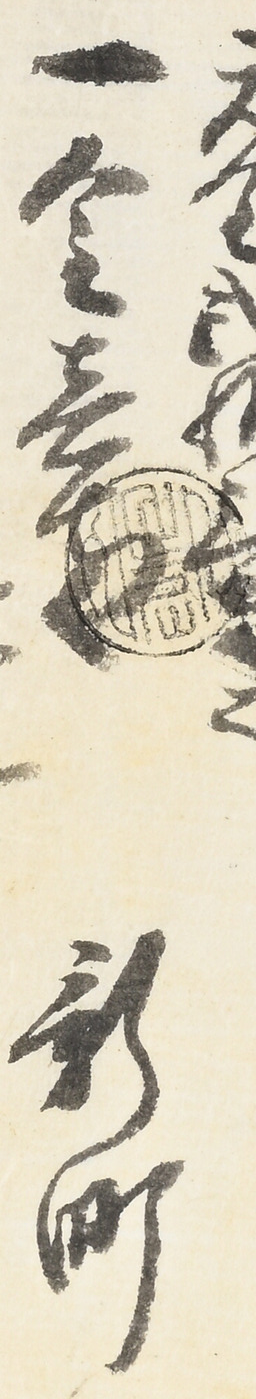一金壱両新町
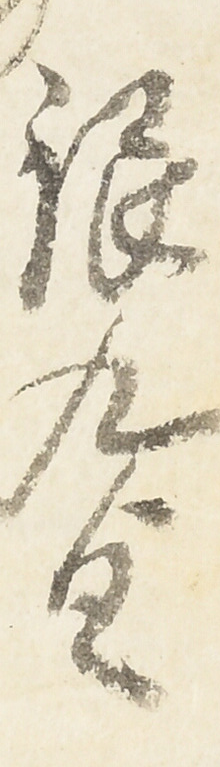銀九匁
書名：御才覚金御利足割渡扣帳
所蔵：伊那市立高遠町図書館・合同会社AMANE
